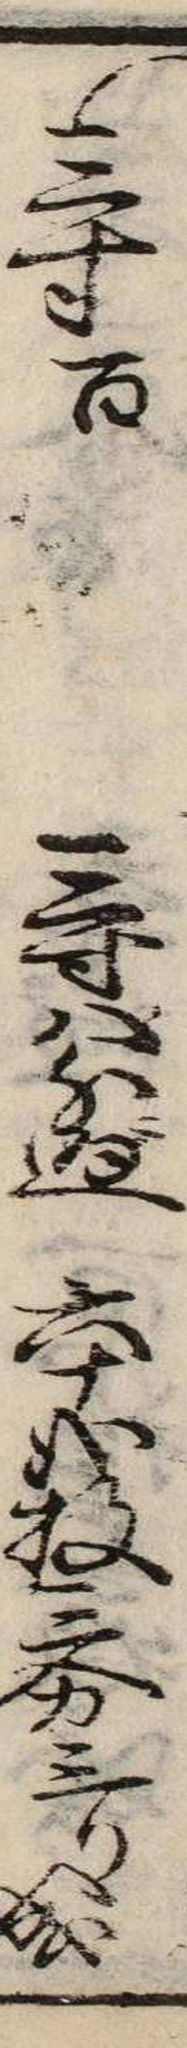三寸百三寸八分に廻六十弐枚三分三りに成
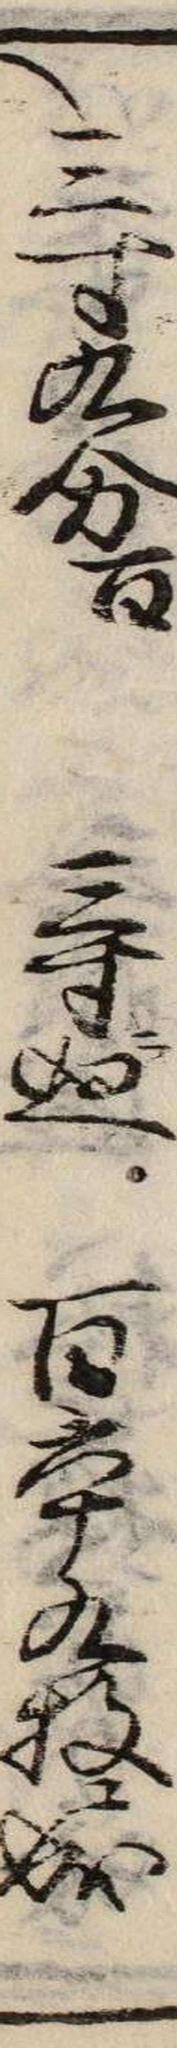三寸九分百三寸に廻百六十九枚に成
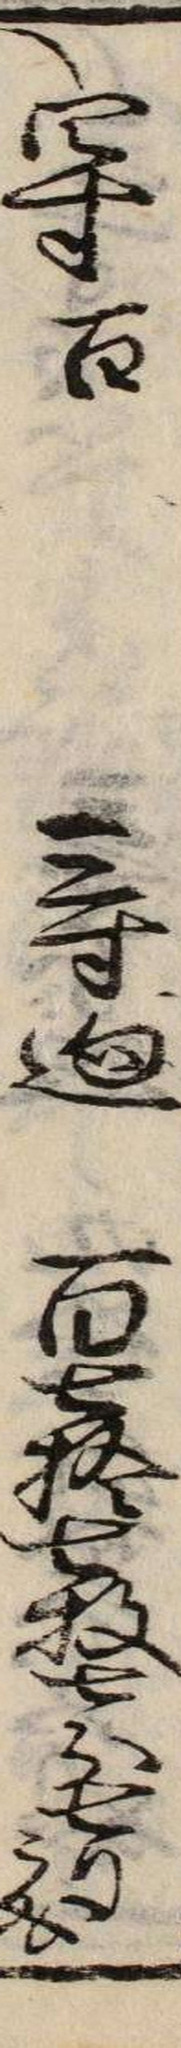四寸百三寸に廻百七拾七枚七分七りに成
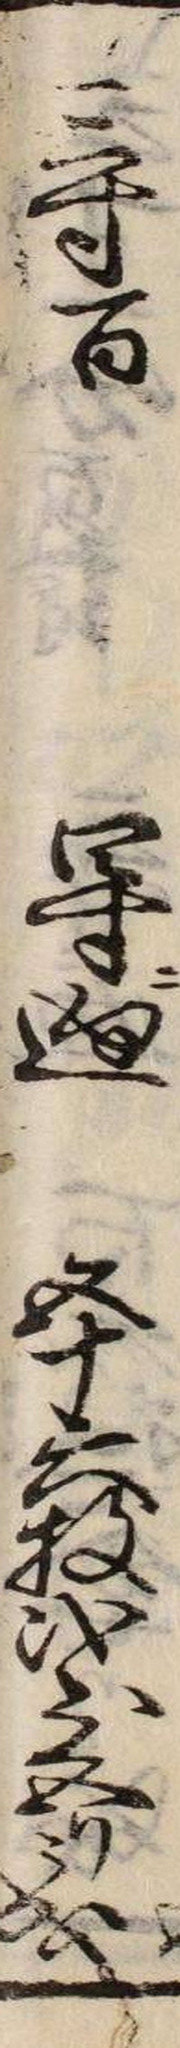三寸百四寸に廻五十六枚弐分五りに成
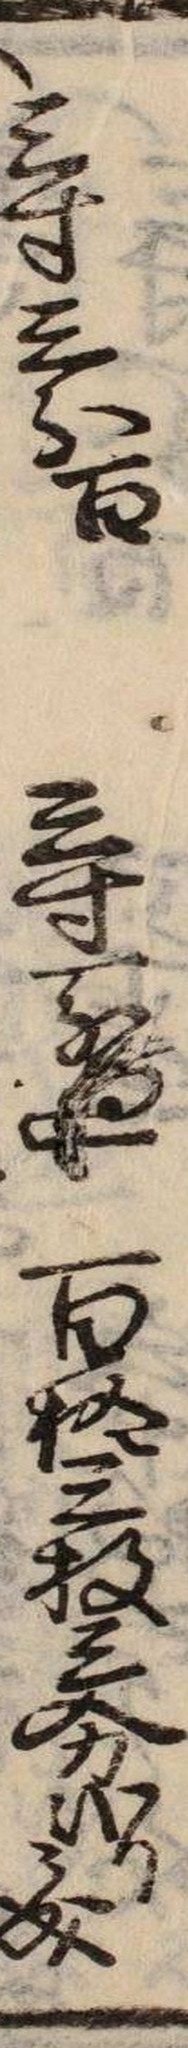三寸三分百三寸一分に廻百拾三枚三分弐りに成
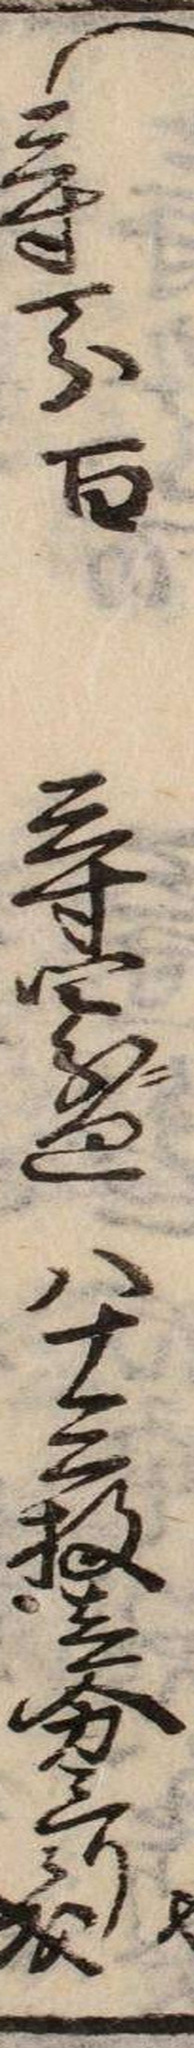三寸一分百三寸四分に廻八十三枚壱分三りに成
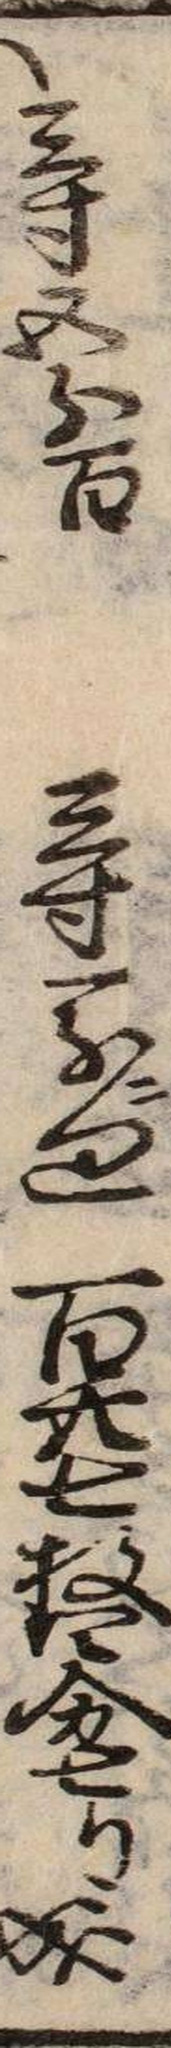三寸五分百三寸一分に廻百廿七枚四分七りに成
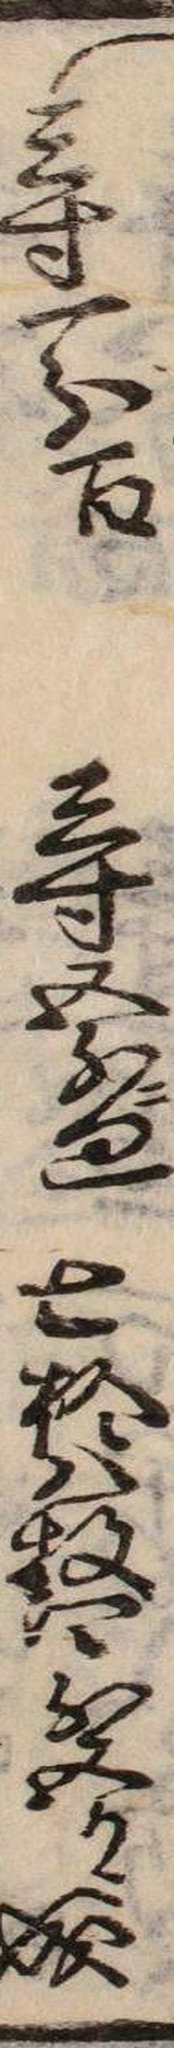三寸一分百三寸五分に廻七拾八枚四分五りに成
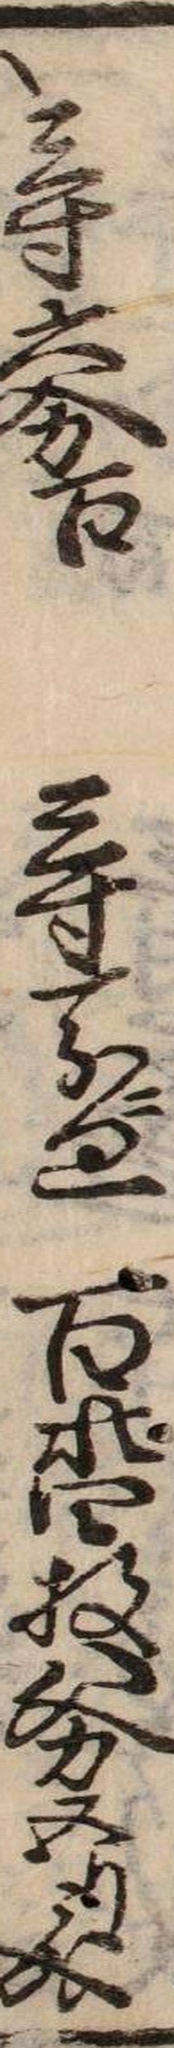三寸六分百三寸一分に廻百卅四枚八分五りに成

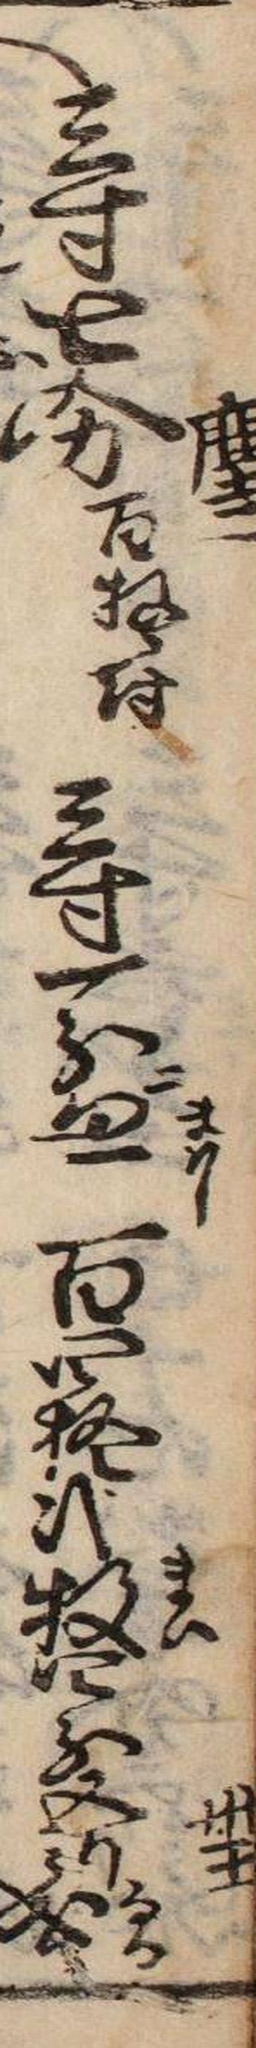三寸七分百枚に付三寸一分に廻百四拾弐枚四分五りに成
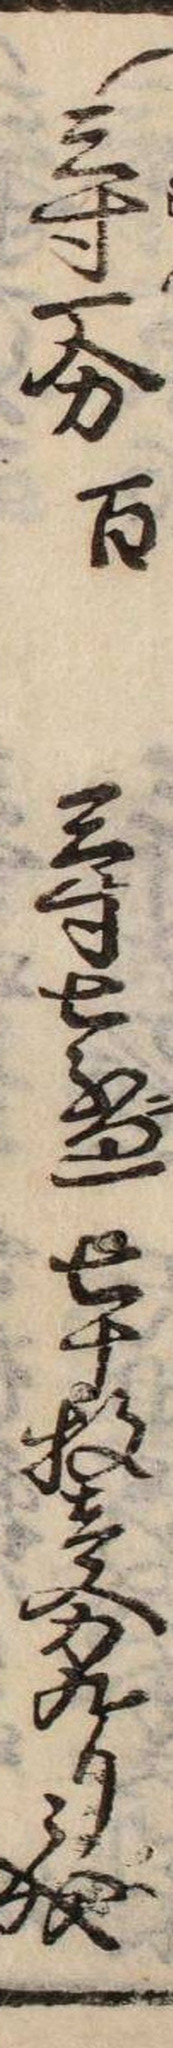三寸一分百三寸七歩に廻七十枚壱分九りに成
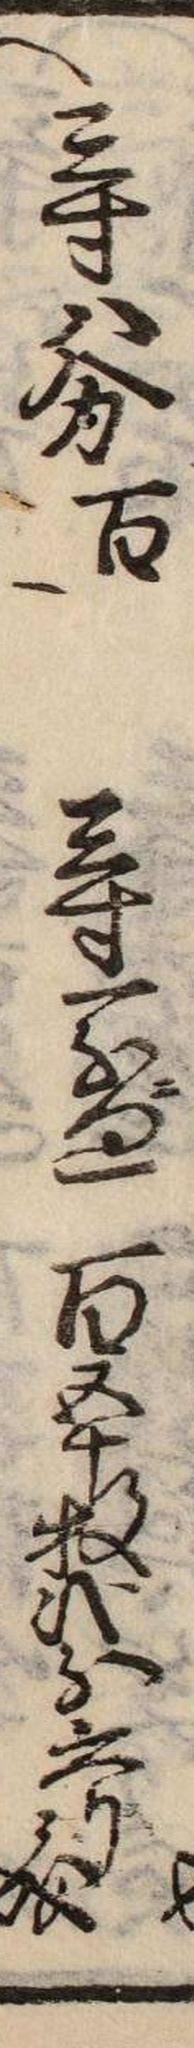三寸八分百三寸一分に廻百五十枚弐分六りに成
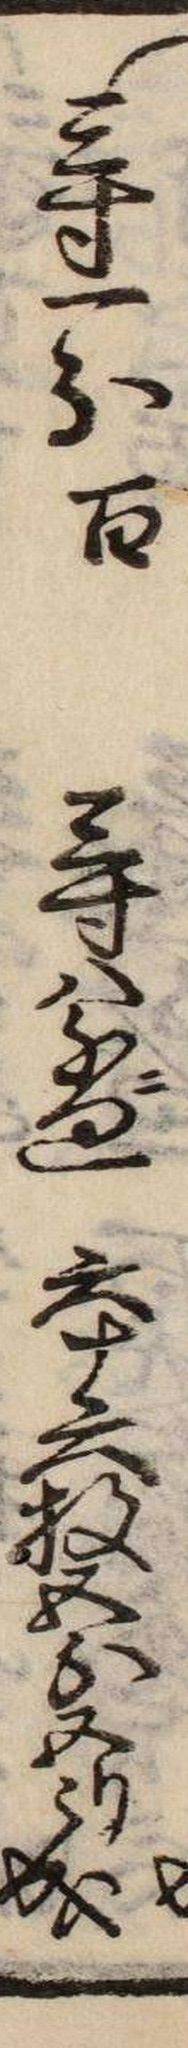三寸一分百三寸八分に廻六十六枚五分五りに成
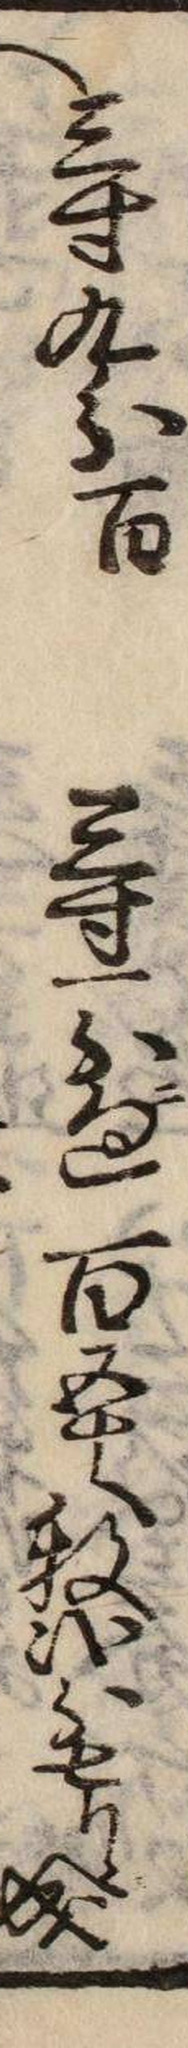三寸九分百三寸一分に廻百五十八枚弐分七りに成
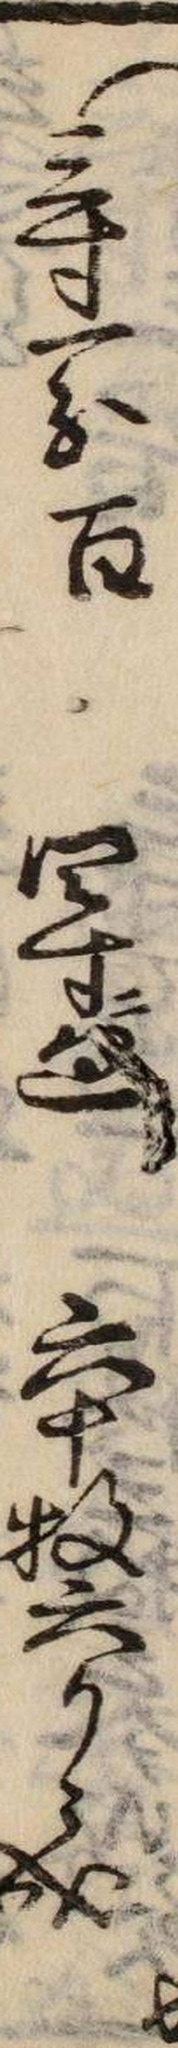三寸一分百四寸に廻六十枚六りに成
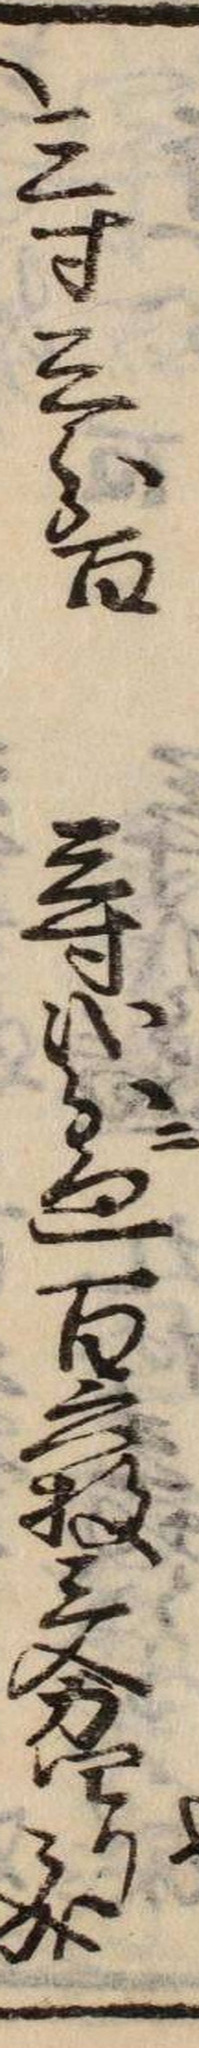三寸三分百三寸弐分に廻百六枚三分四りに成
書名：塵劫記（寛永11年自跋、京都府立京都学・歴彩館追貴8）
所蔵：京都府立京都学・歴彩館 国文学研究資料館
